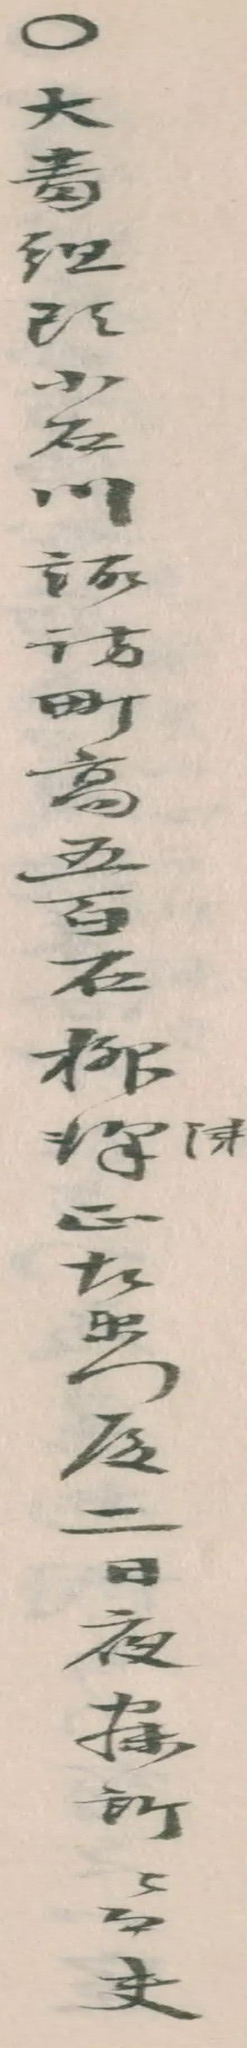〇大番組頭小石川諏訪町高五百石柳沢正左衛門殿二日夜寝所にて夫
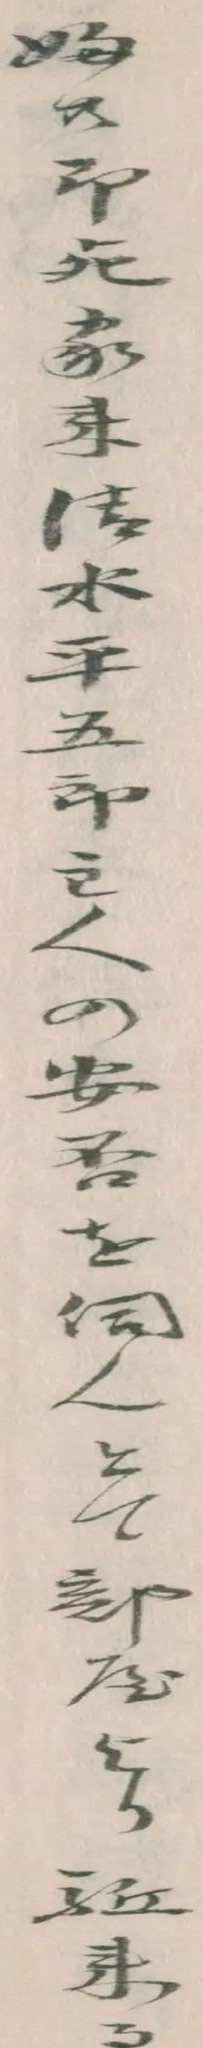婦共即死家来清水平五郎主人の安否を伺んとて部屋より駈来る
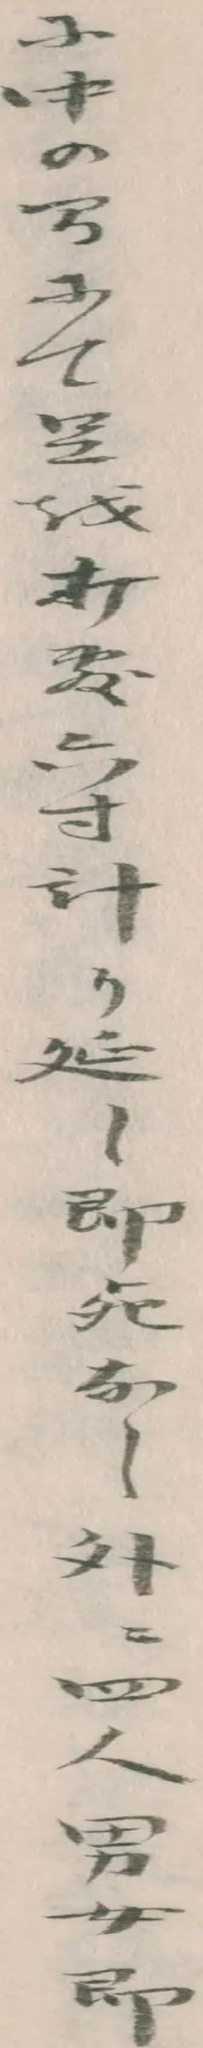に中の間にて足を打敷六寸計り延し即死なし外に四人男女即
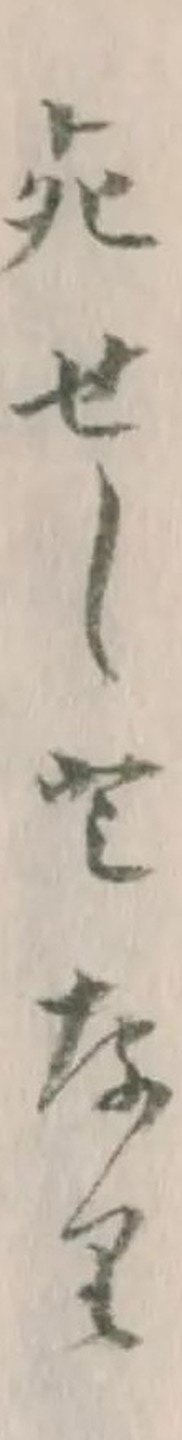死せしとなり
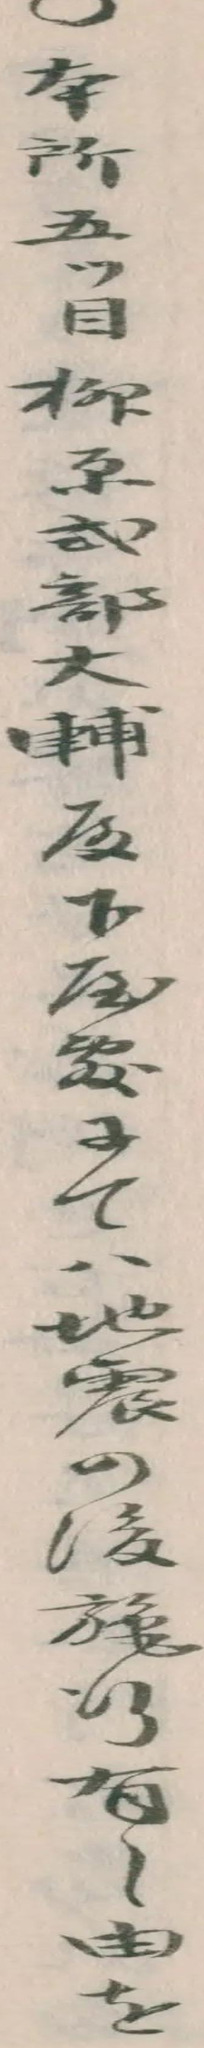〇本所五ツ目柳原式部大輔殿下屋敷にては地震の後施行有し由を
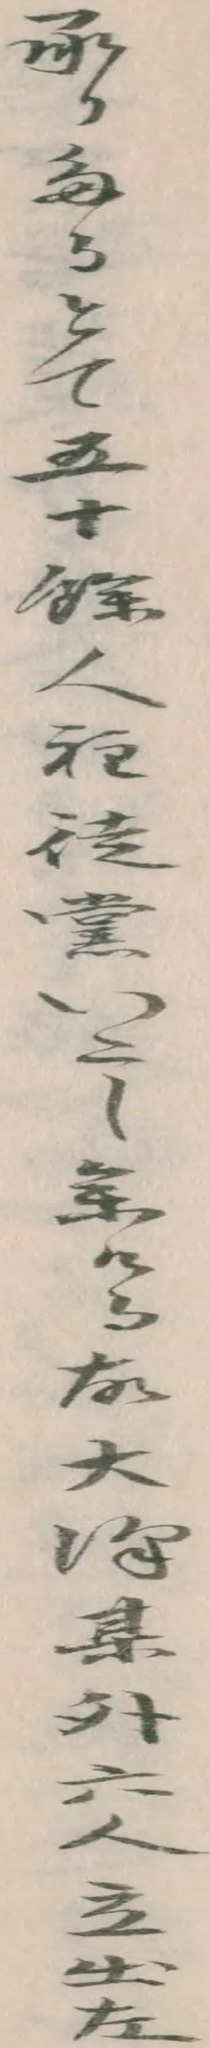承りたるとて五十余人程徒党いたし参ける故大沢某外六人立出左
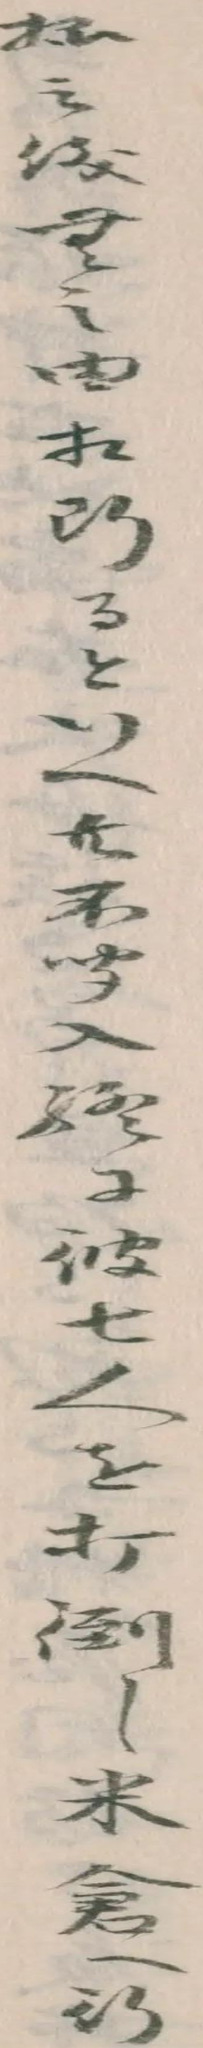様之儀無之由相断るといへ共不聞入終に彼七人を打倒し米倉へ行
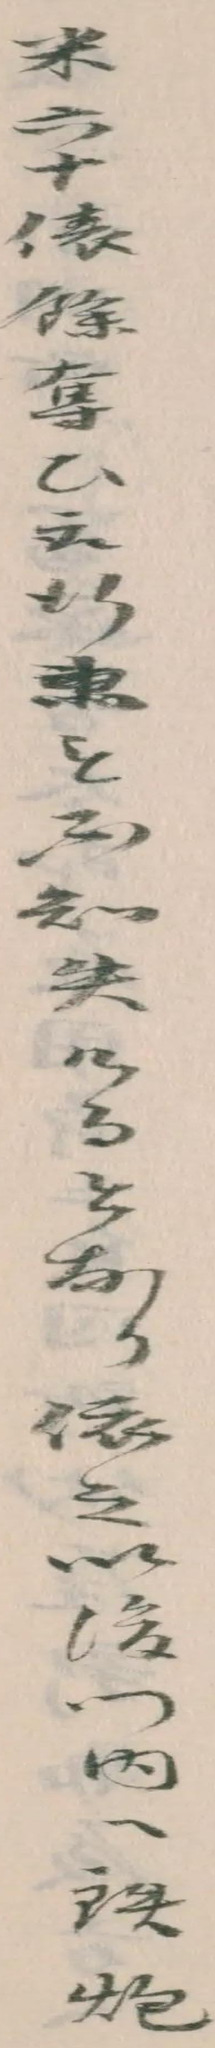米六十俵余奪ひ取行ゑ】も不知失けるとなり依之以後門内へ鉄炮
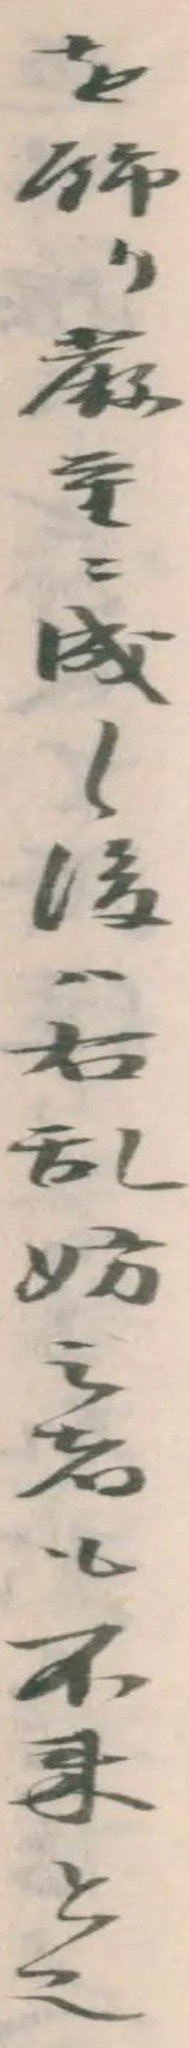を飾り厳重に成し後は右乱妨之者も不来と也
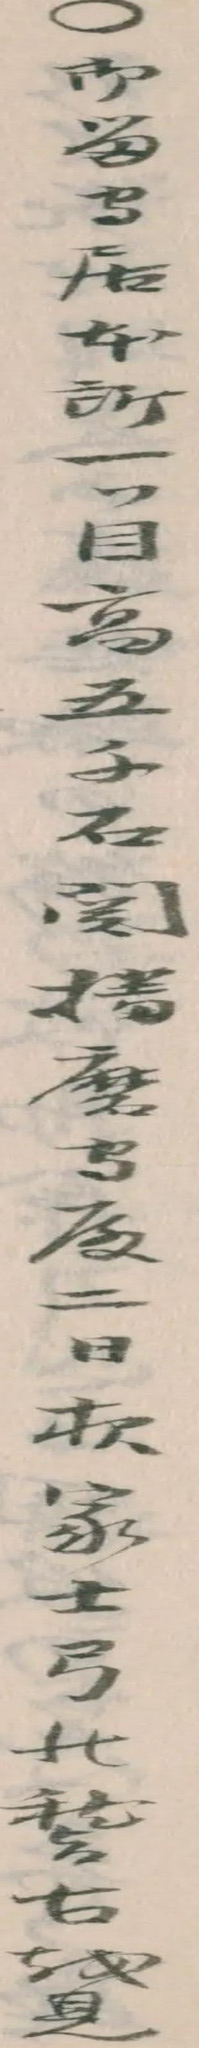〇御留守居本所一ツ目高五千石関播磨守殿二日夜家士弓の稽古を見
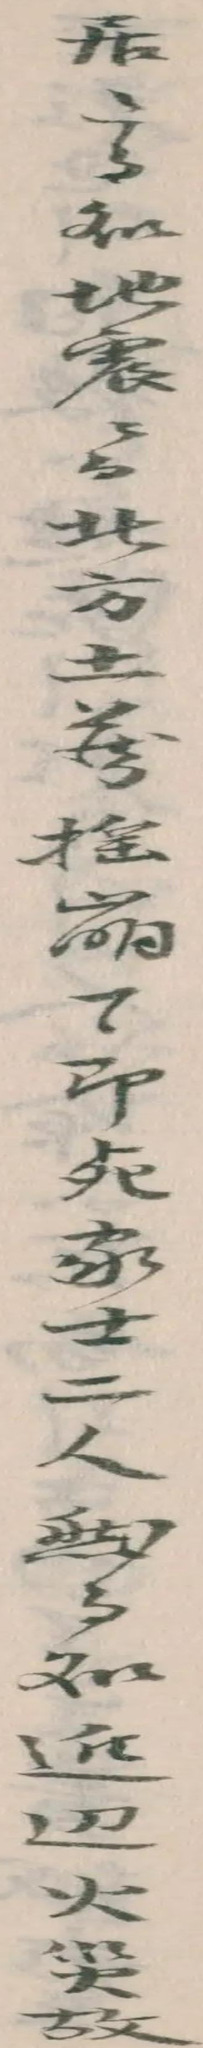居たる処地震にて北方土蔵揺崩て即死家士二人然る処近辺火災故
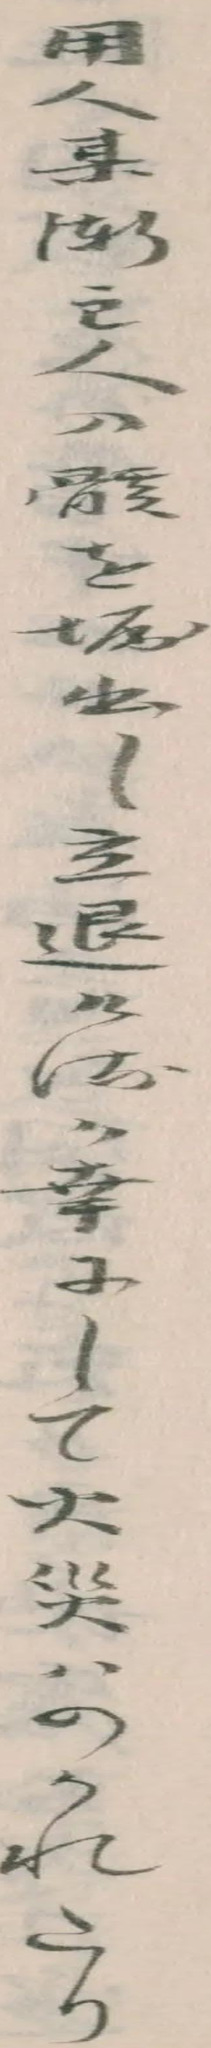用人某漸主人の骸を掘出し立退けるか幸にして火災はのかれたり
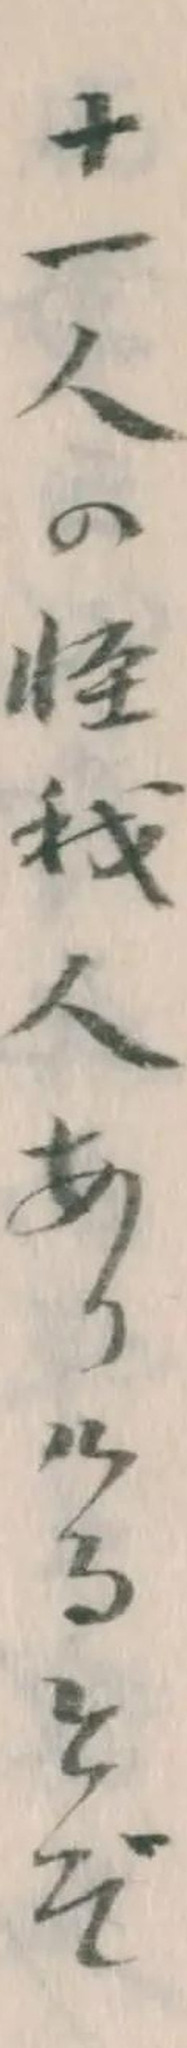十一人の怪我人ありけるとぞ
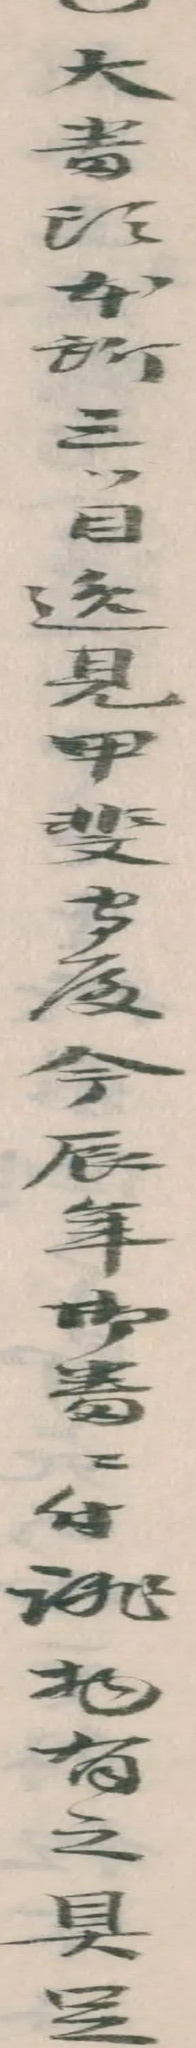〇大番頭本所三ツ目逸見甲斐守殿今辰年御番付誂物有之具足
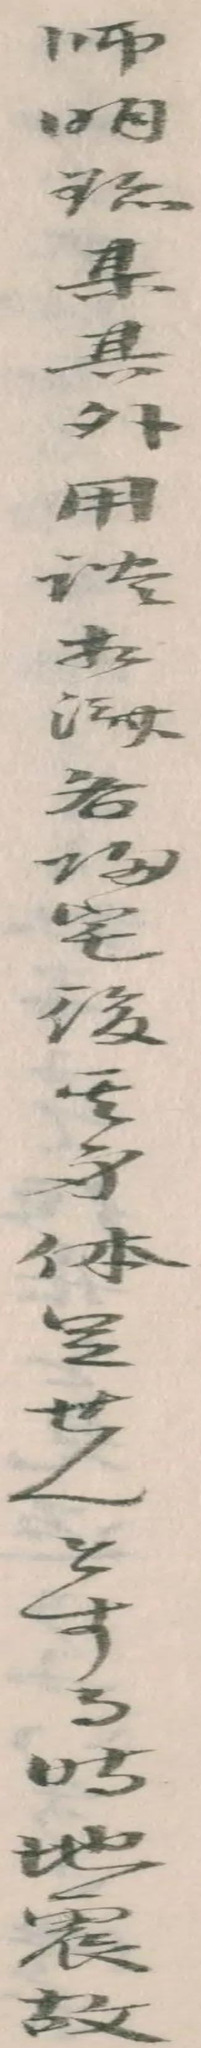師明珍某其外用談相済各帰宅後其身体足せんとする時地震故
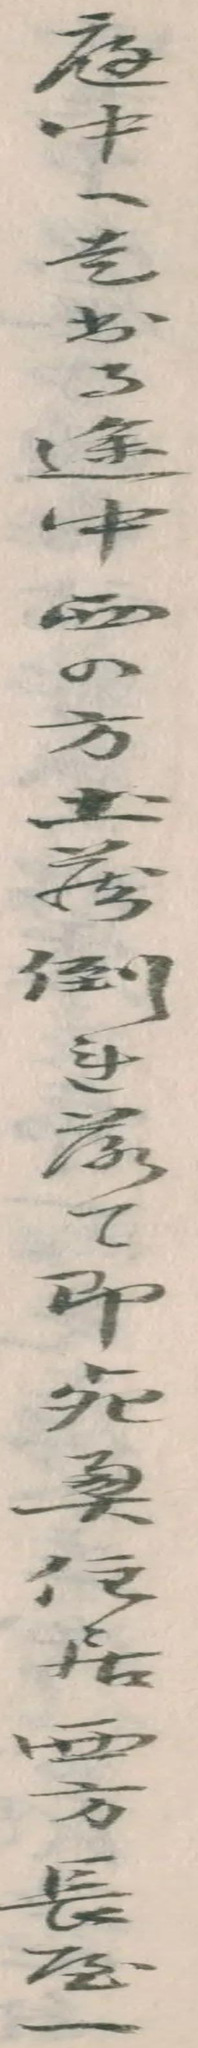庭中へ走出る途中西の方土蔵倒れ落て即死奥住居西方長屋一
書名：地災撮要. 巻10(地震之部) 上,下
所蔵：国立国会図書館 National Diet Library, JAPAN
